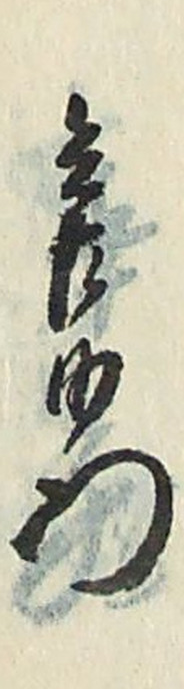兵左衛門
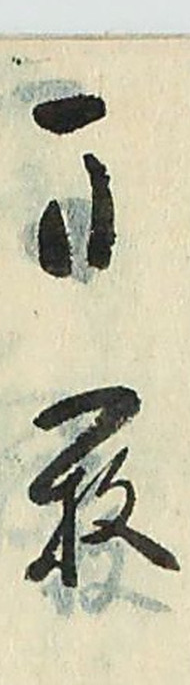一同一枚同
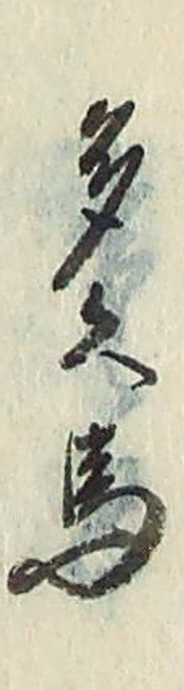多久馬
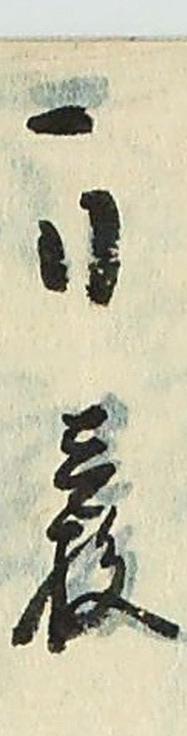一同壱枚同
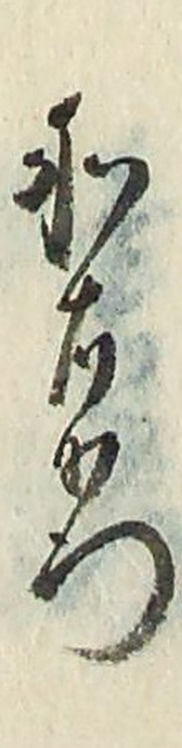和右衛門
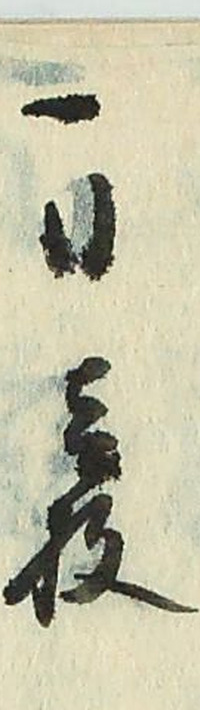一同壱枚同
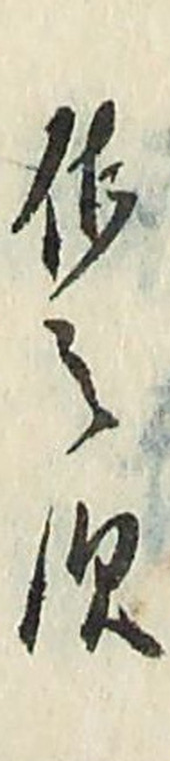佐之次
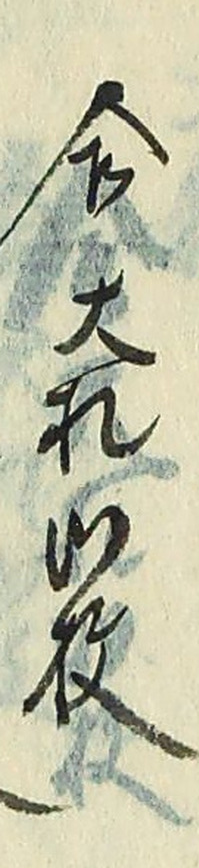合大札弐枚
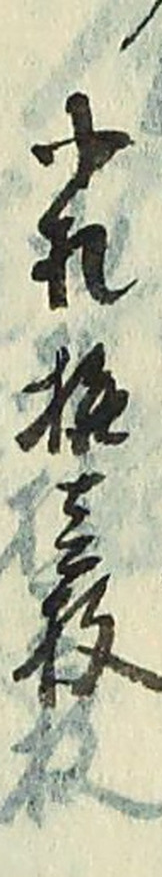小札拾壱枚
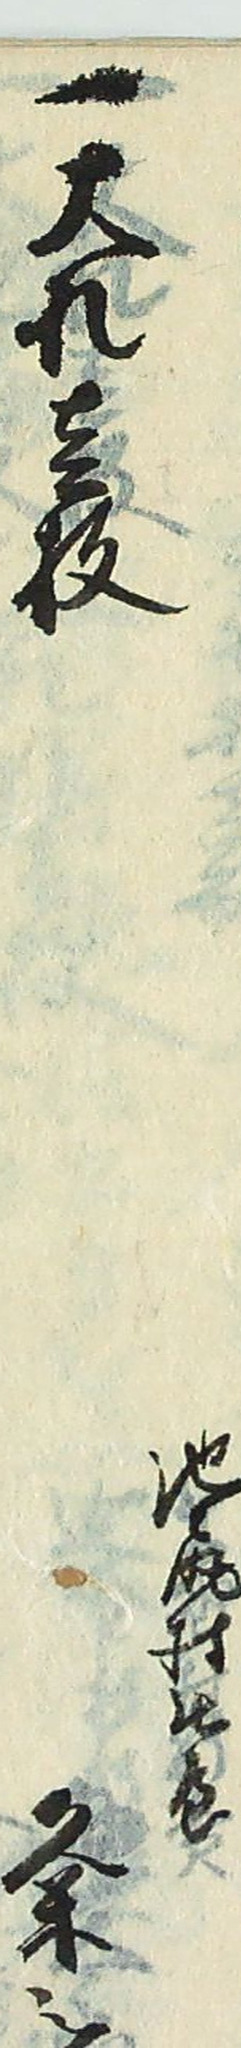一同壱枚同
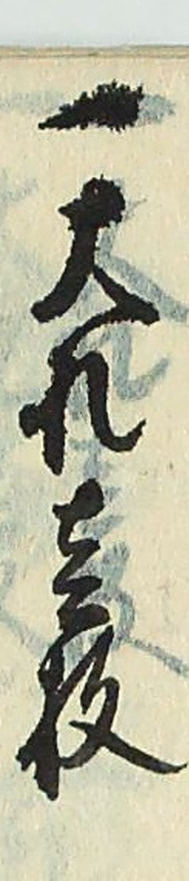一同壱枚同
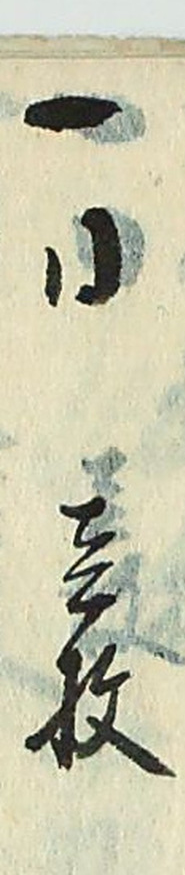一同壱枚同
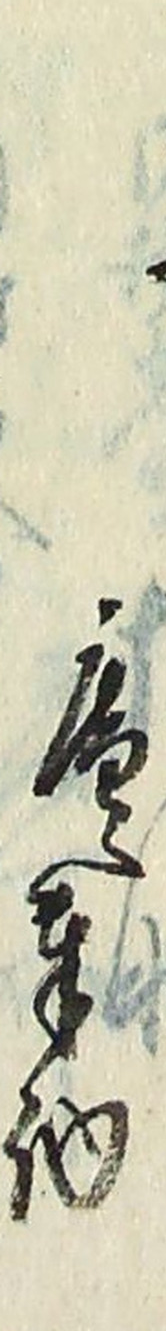庵へ奉納
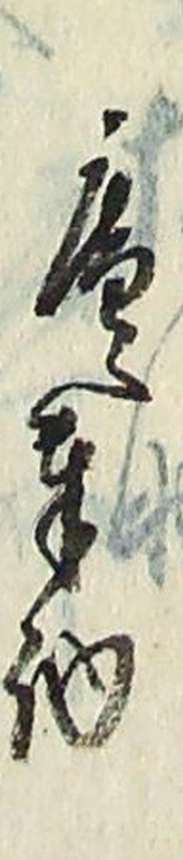庵へ奉納
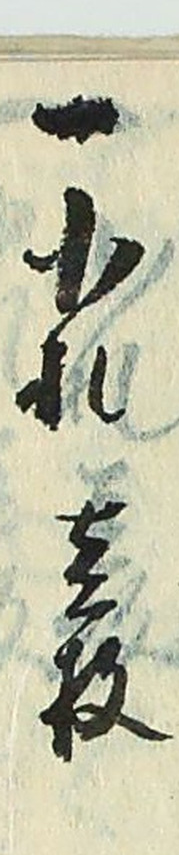小札拾壱枚
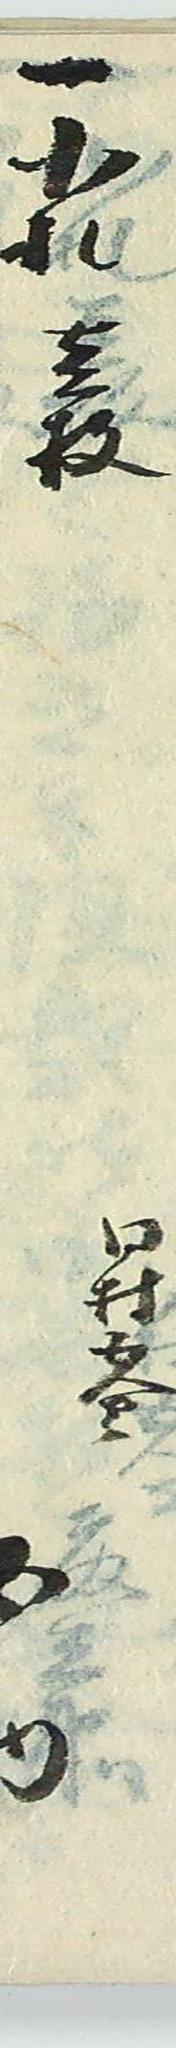一小札壱枚同村五人与
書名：諸御用御□受書控
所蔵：鳴門教育大学 Naruto University of Education
